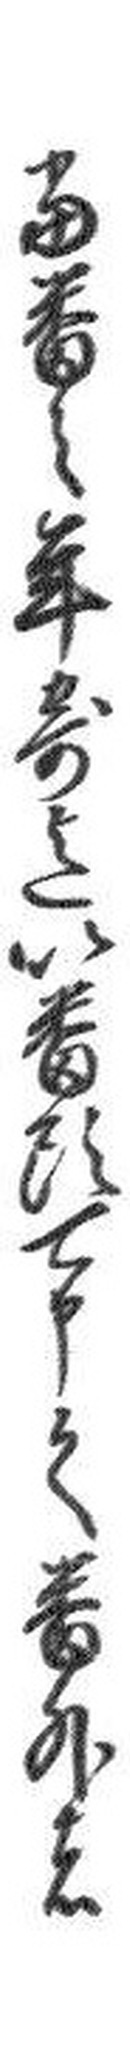当番之年寄迄以番頭可申之番外者
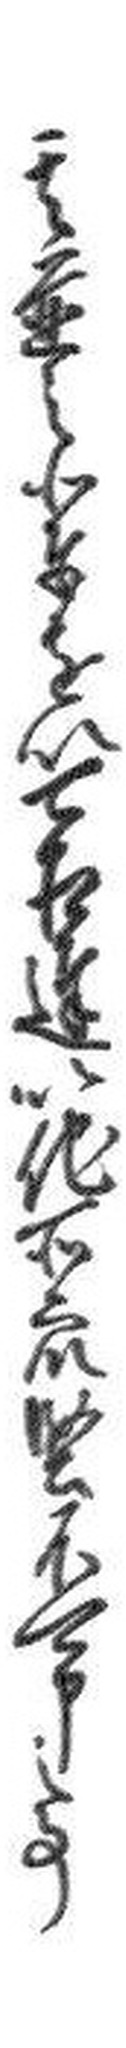其並之輩を以可相達以他所衆堅不可申之事
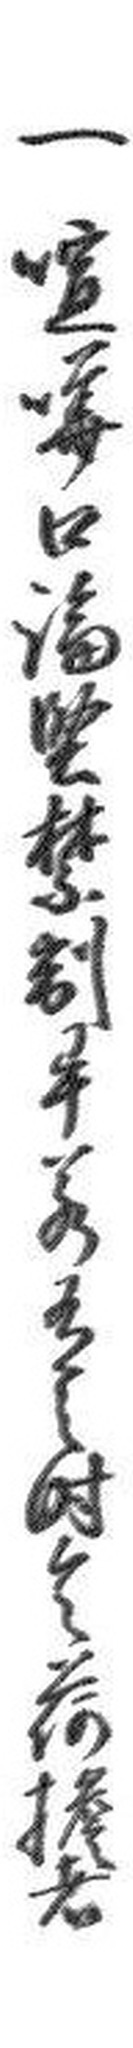一喧嘩口論堅禁制畢若有之時令荷担者
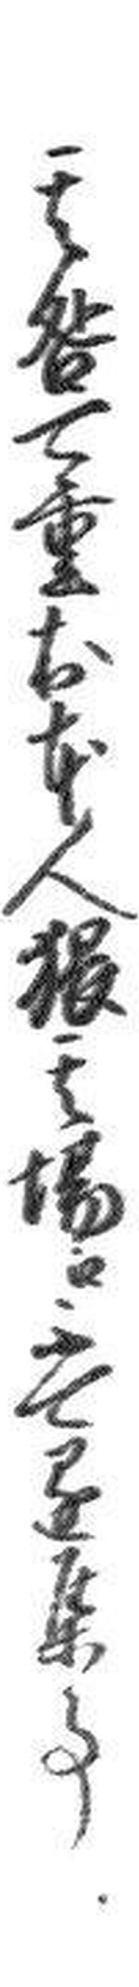其咎可重於本人猥其場江不可懸集事
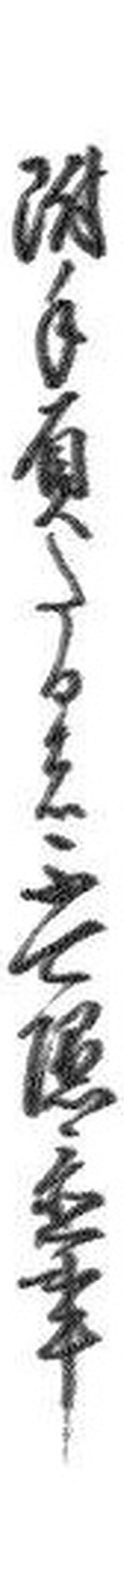附手負たる者不可隠置事
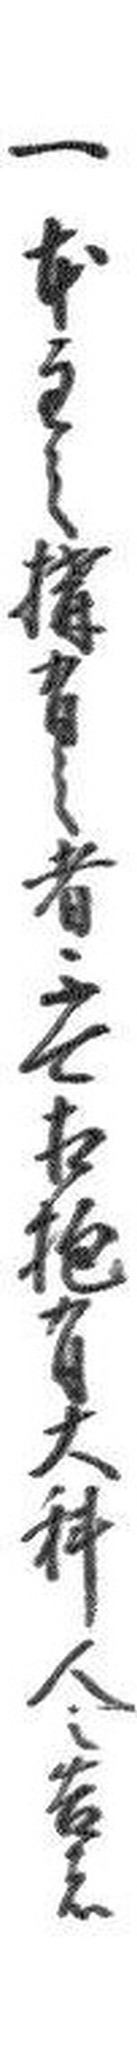一本主之構有之者不可相抱有大科人之告者
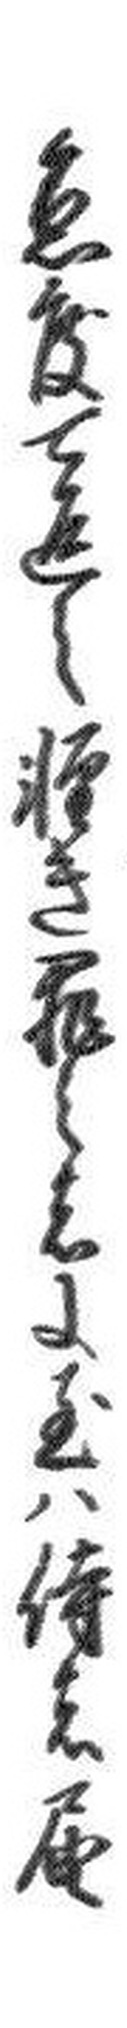急度可返之軽き罪之者に至ハ侍者届
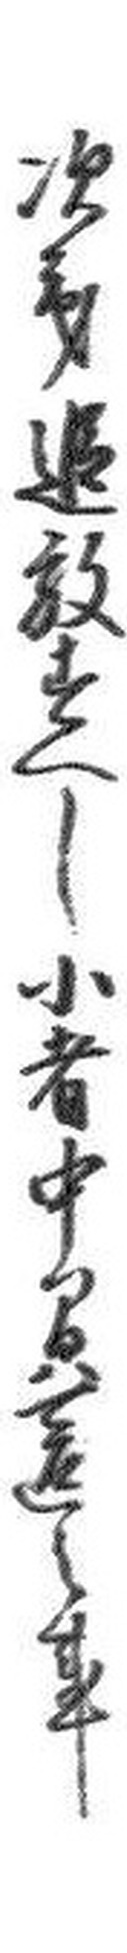次第退散すへし小者中間ハ可返之事
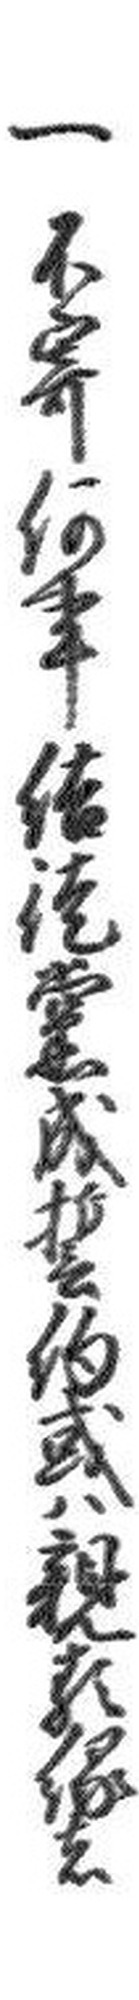一不寄何事結徒党成誓約或ハ親類縁者
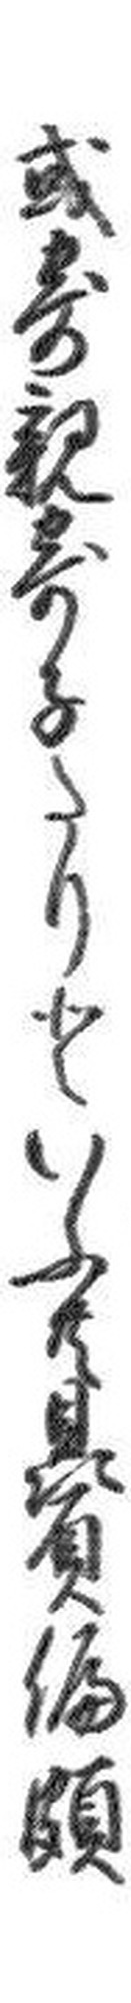或寄親子たりといふ共贔負偏頗
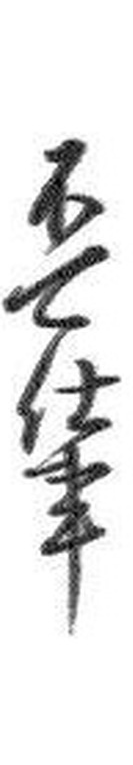不可仕事

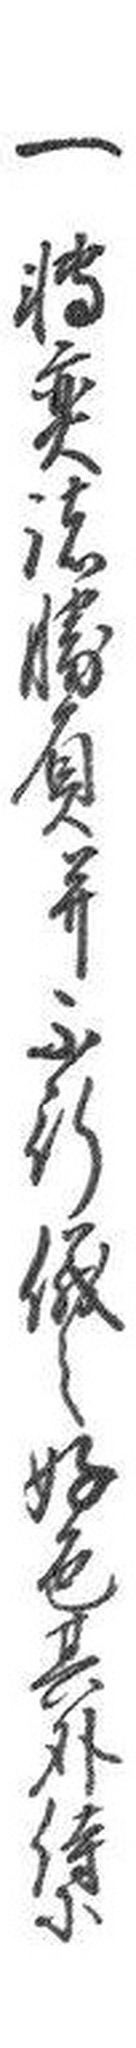一轉奕諸勝負并不行儀之好色其外侍に
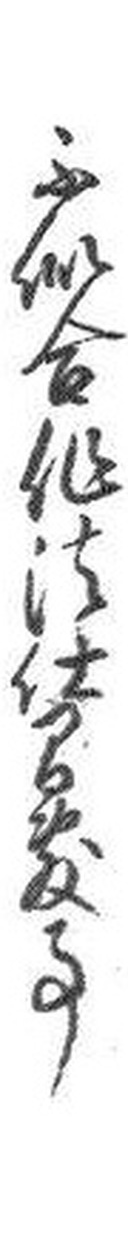不似合作法仕間敷事
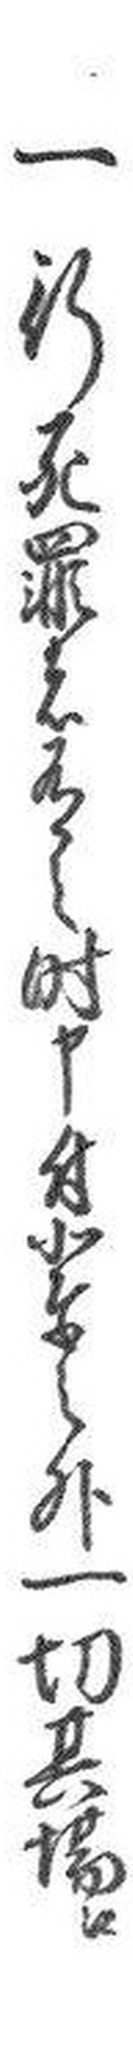一行死罪者有之時申付輩之外一切其場江
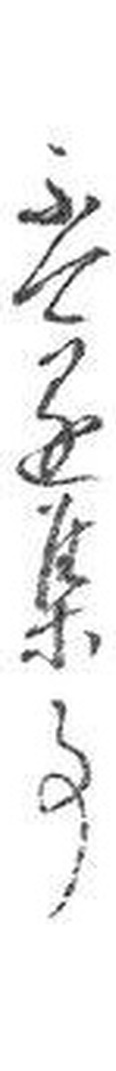不可懸集事
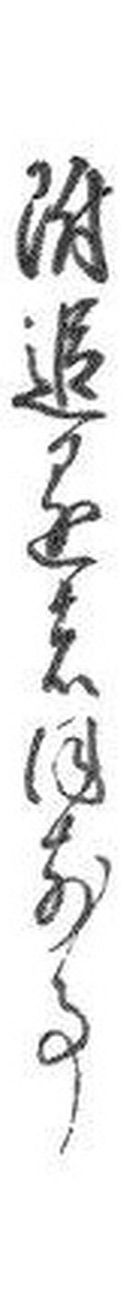附追懸者同前事
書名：家譜 十一 昌親公 従延宝二年到延宝四年八月
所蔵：福井県文書館 Fukui Prefectural Archives
